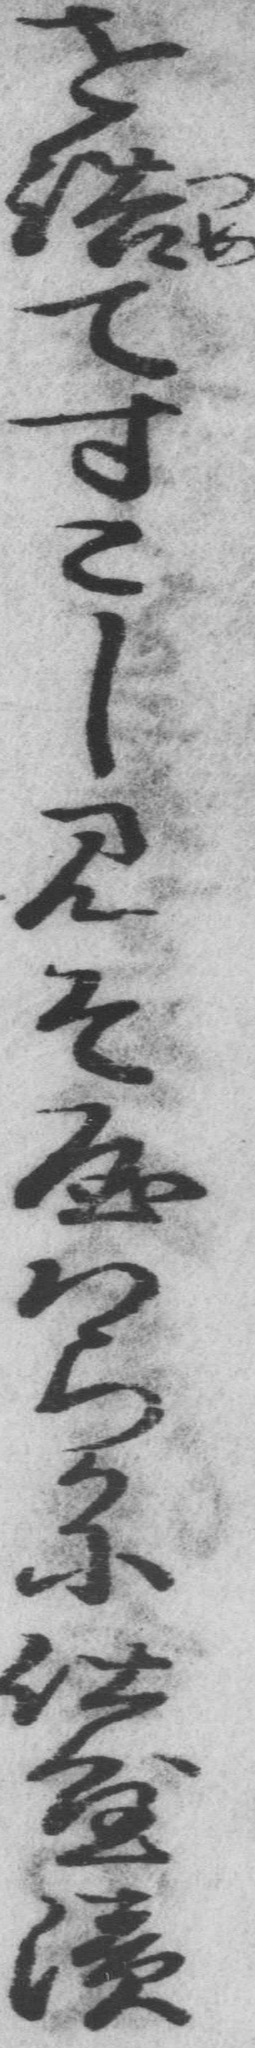を詰てすこしみそやはらかに仕懸漬
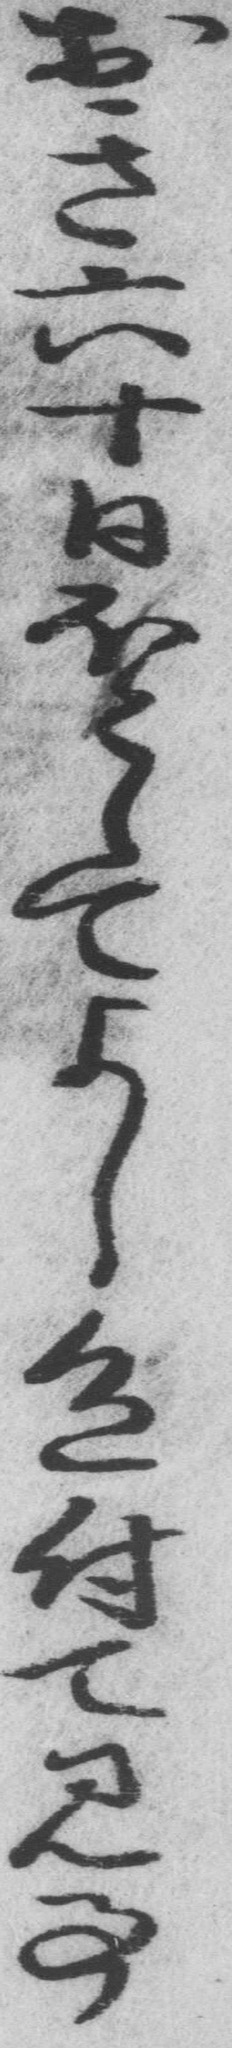おき六十日ほとしてよし色付て見事
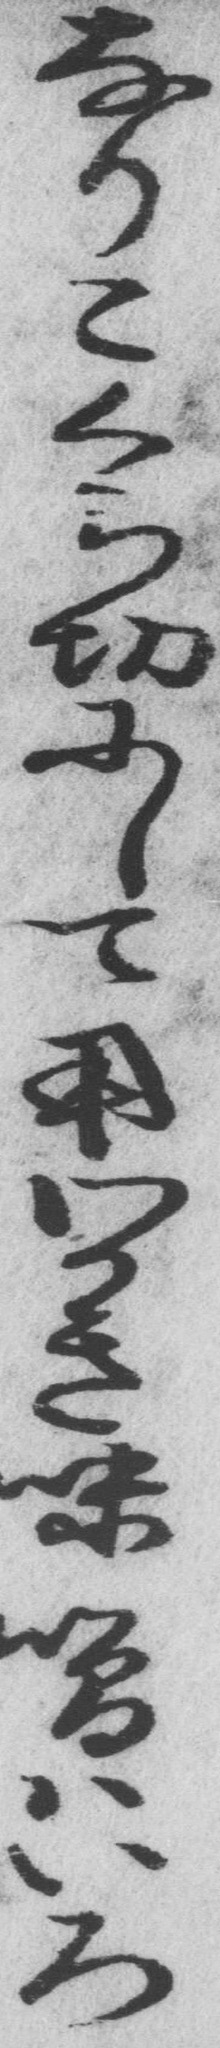なりこくち切にして用わかき味噌はいろ
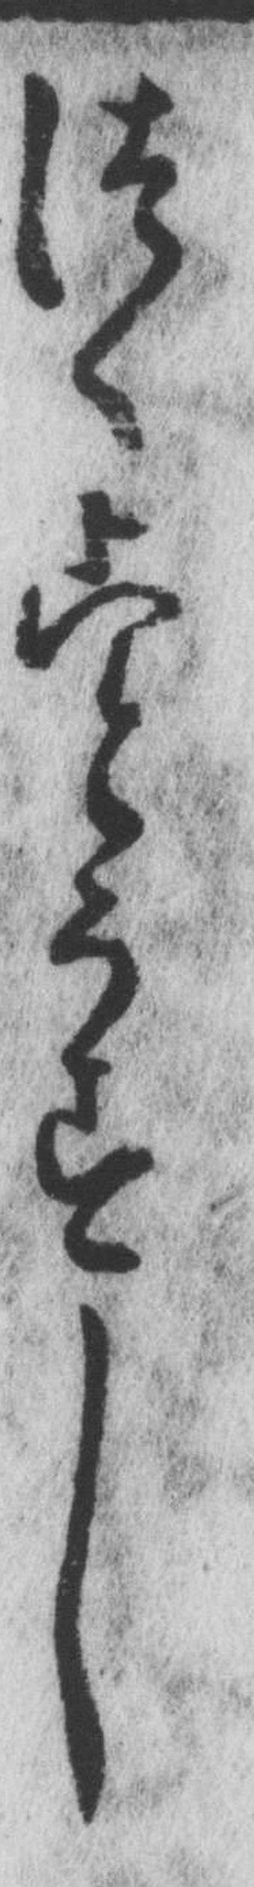つくことうすし
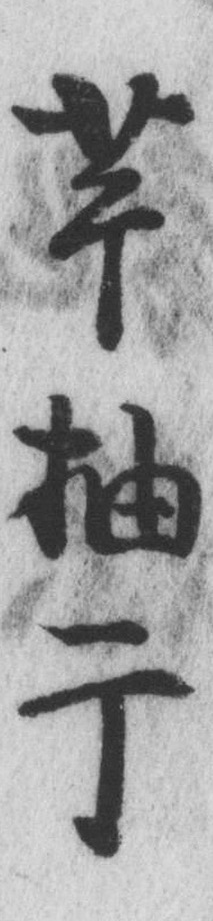芋柚干
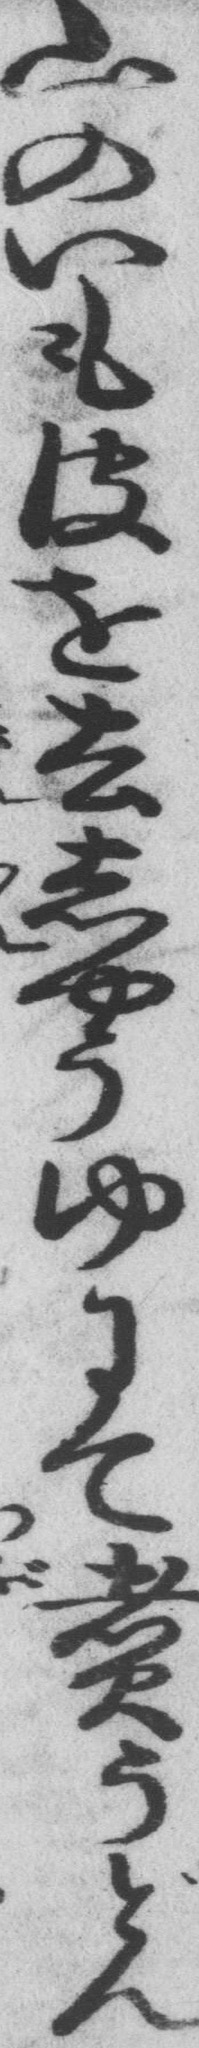山のいも皮を去しやうゆにて煮うどん
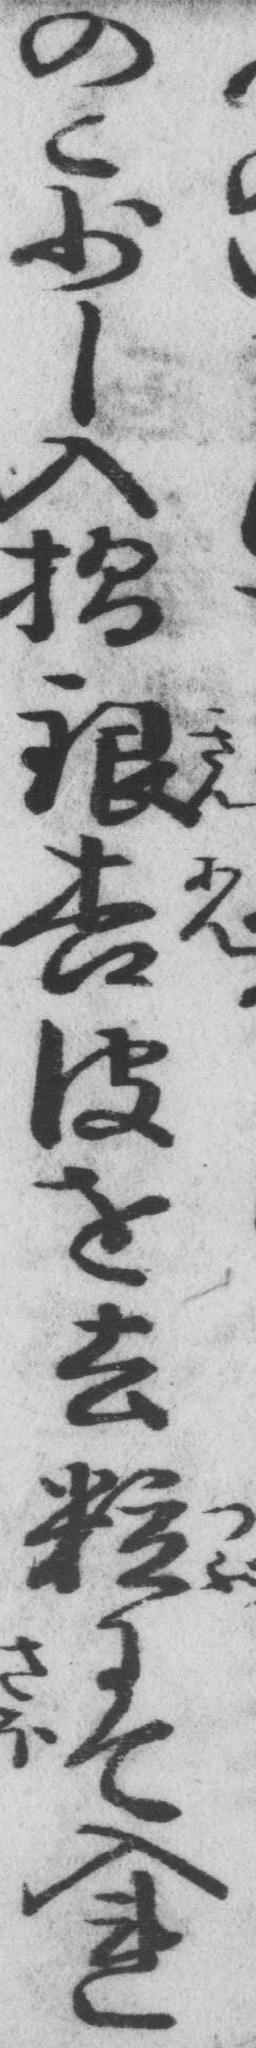のこ少し入摺銀杏皮を去粒にて入れ
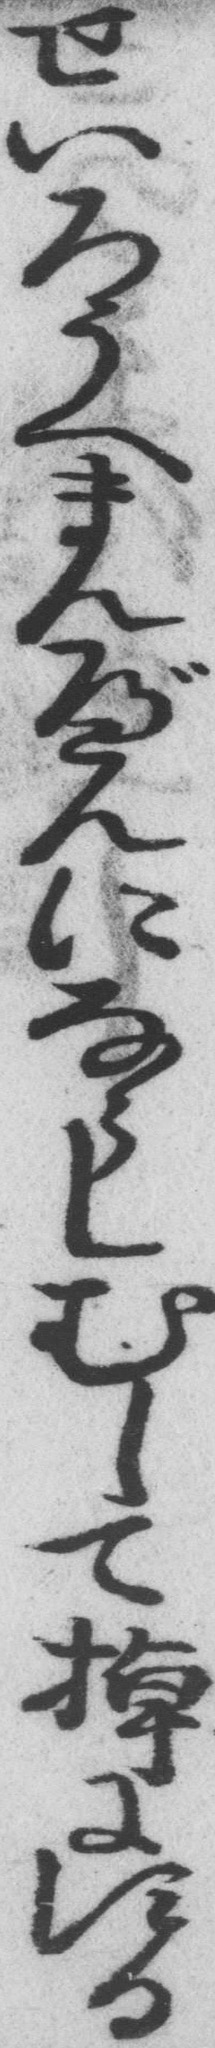せいろうへまんべんにならしむして棹にする
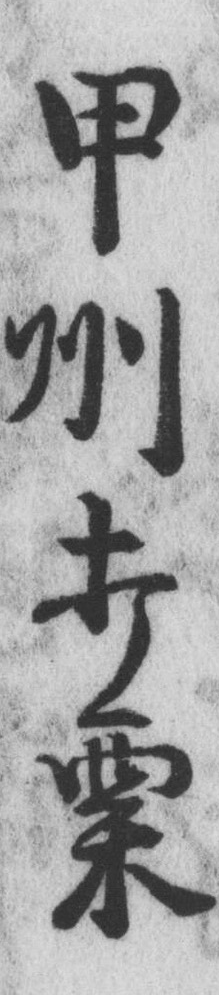甲州打栗
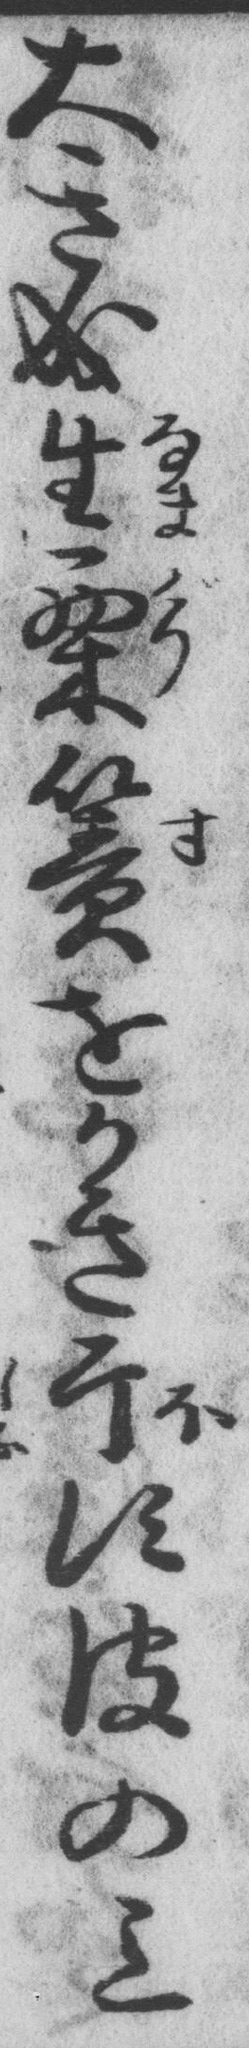大き成生栗簀をかき干す皮の上
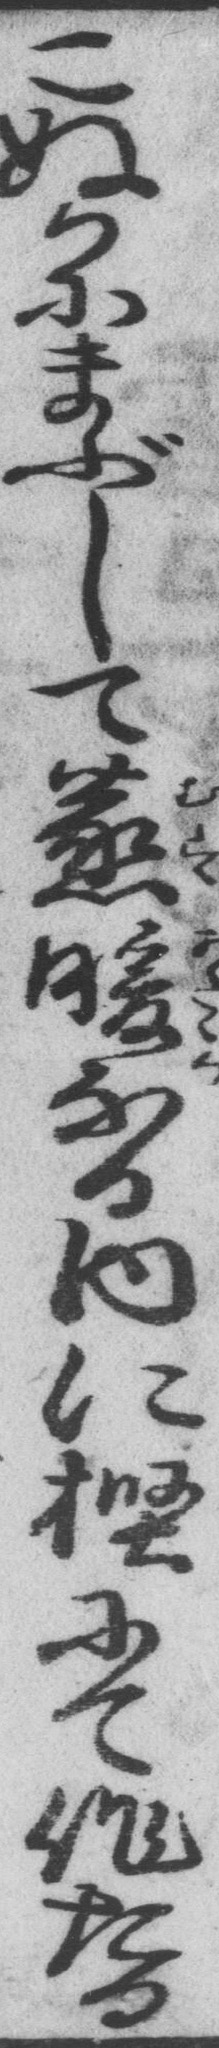こぬかにまぶして蒸暖なる内に樫にて作たる
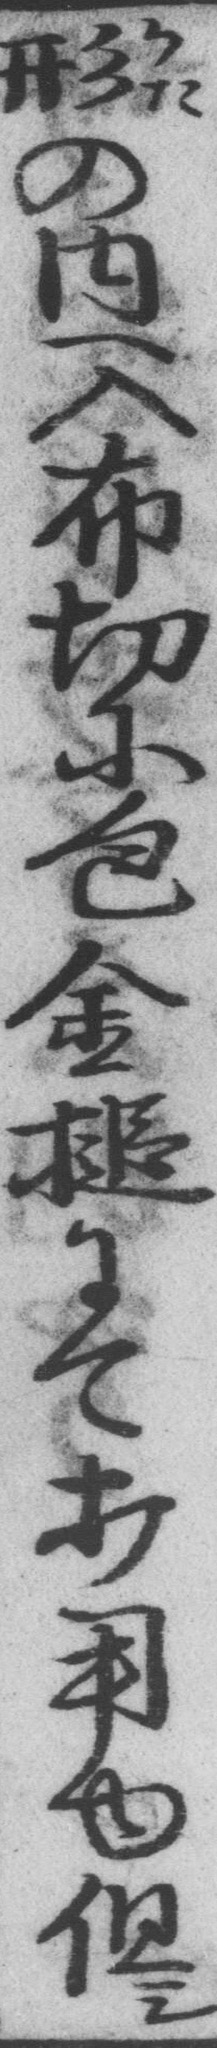形の内へ入布切に包金槌にて打用ゆ但し

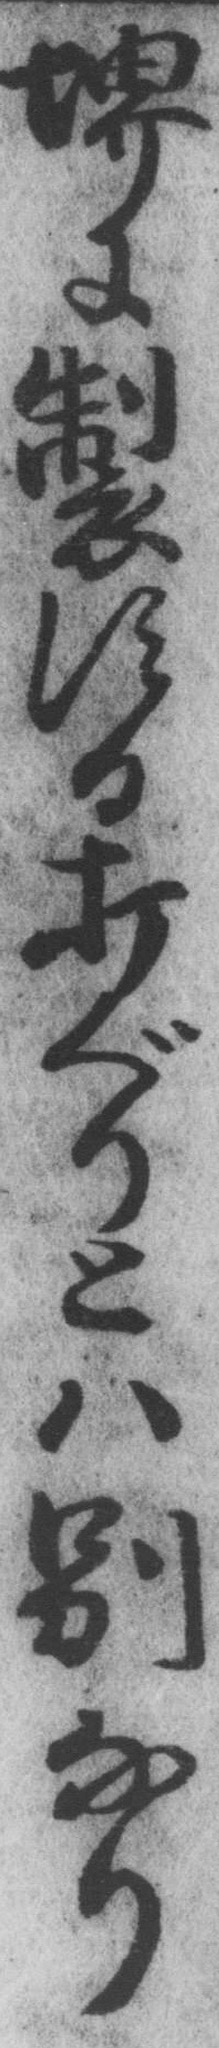堺に製する打ぐりとは別なり
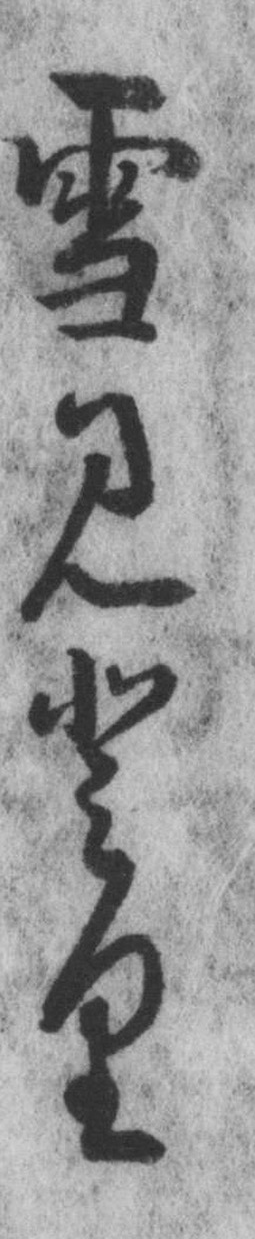雪みとり
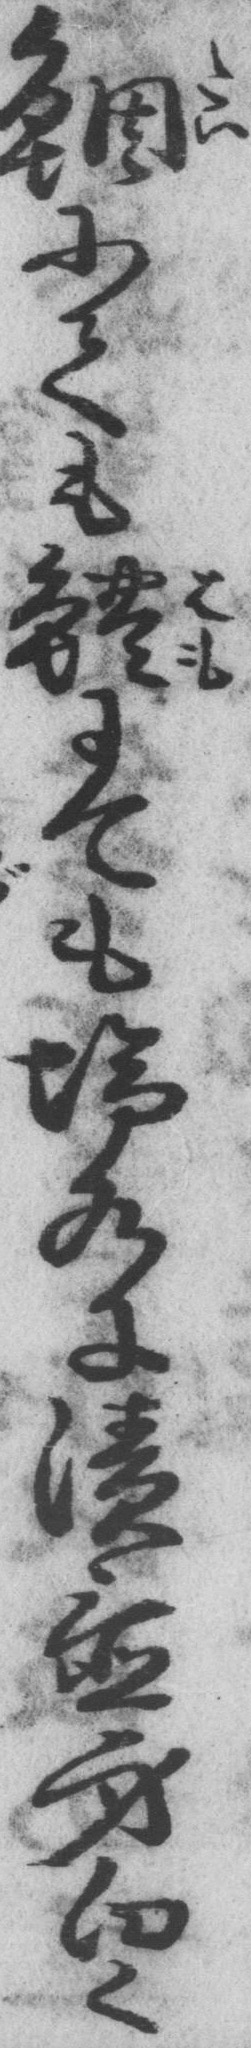鯛にても鱧にても塩水に漬置身白く
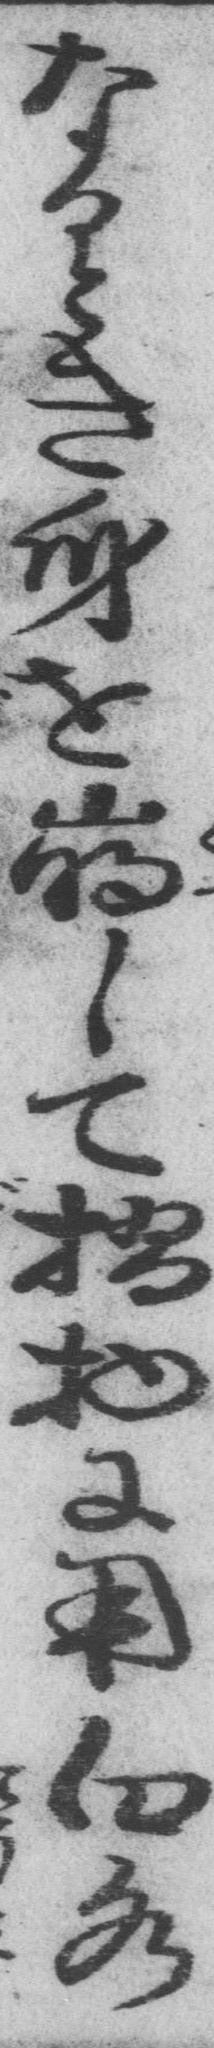なるとき身を崩して摺物に用白水
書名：料理山海郷
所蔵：大阪府立大学学術情報センター 国文学研究資料館
